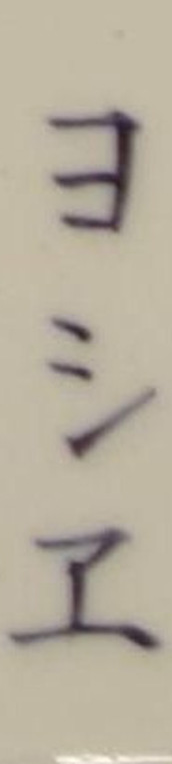ヨシヱ
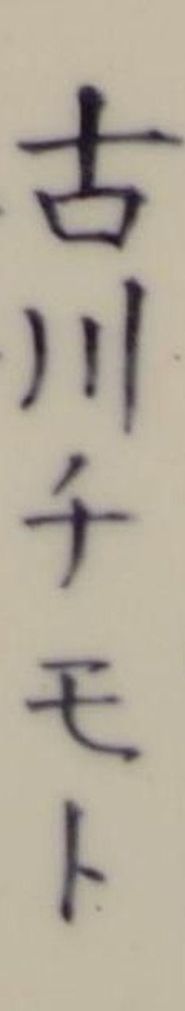古川チモト
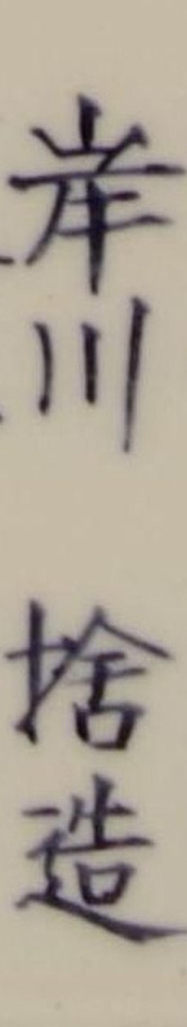岸川捨造
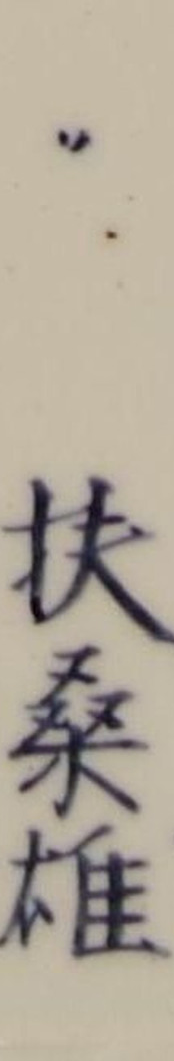扶桑雄
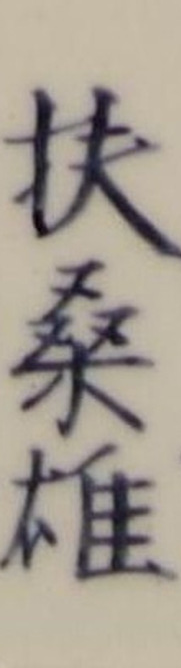扶桑雄
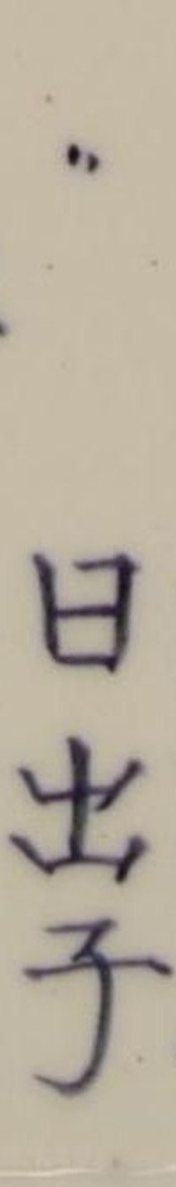日出子
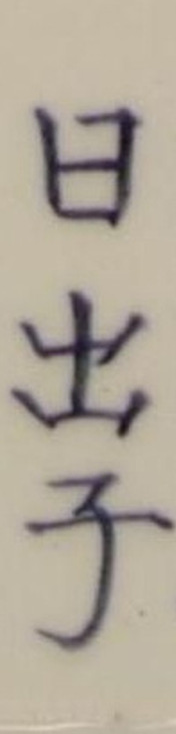日出子
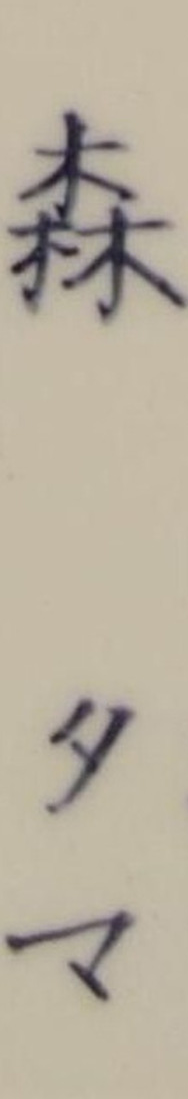森タマ
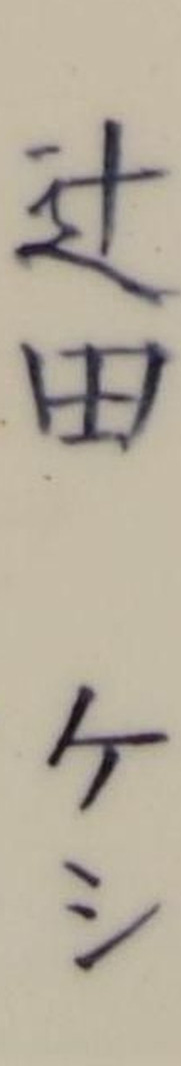辻田ケシ
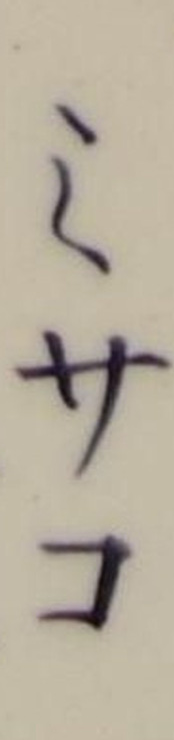ミサコ
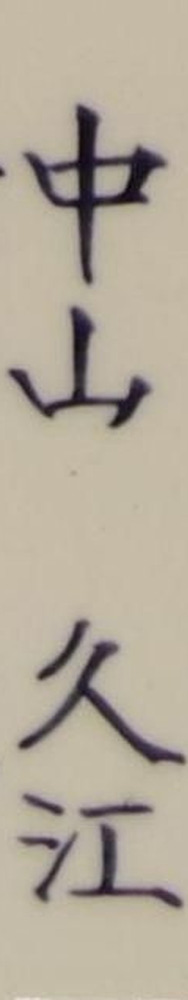中山久江
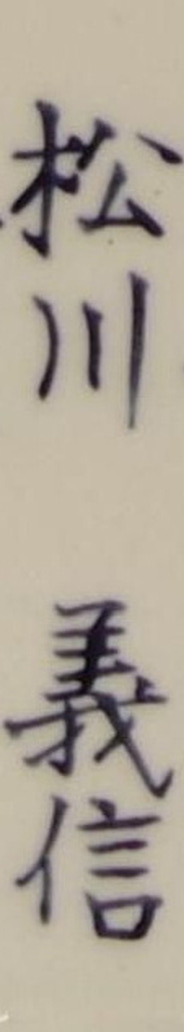松川義信
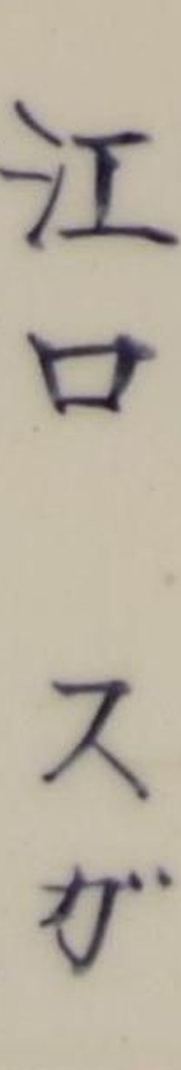江口スガ
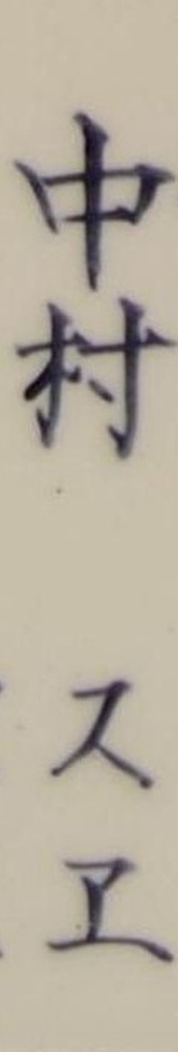中村スヱ
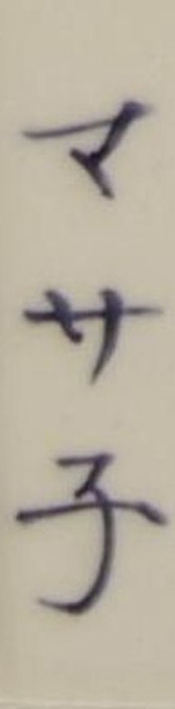マサ子

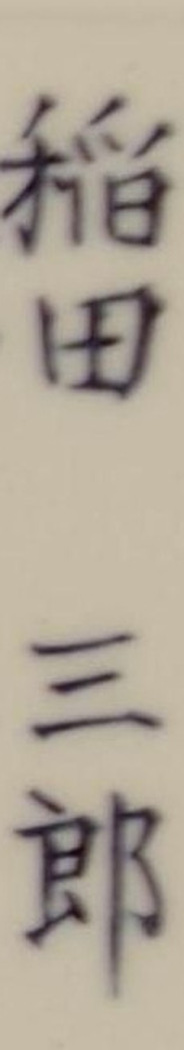稲田三郎
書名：M~S
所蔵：高野山金剛峯寺
